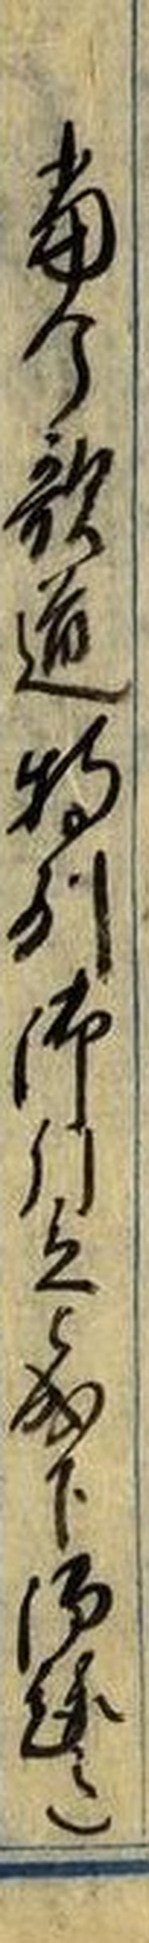當今歌道特別御引立被成下御趣意
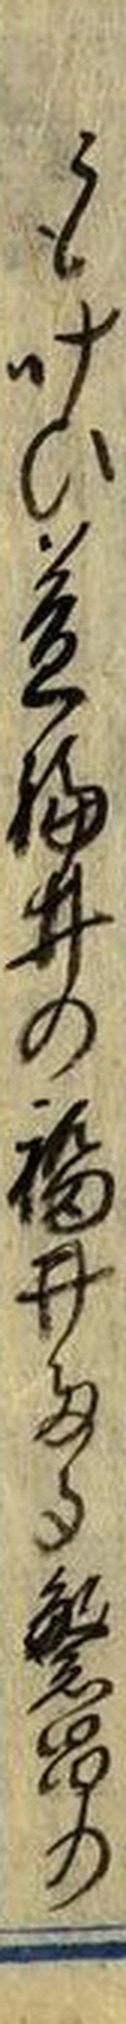ニも叶ひ蓋福井の福井たる繁昌の
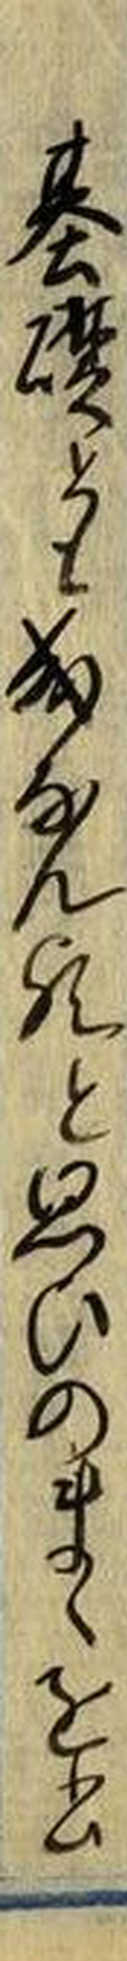基礎とも成なん歟と思ひのまゝを書
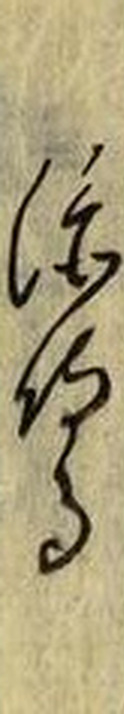添侍る
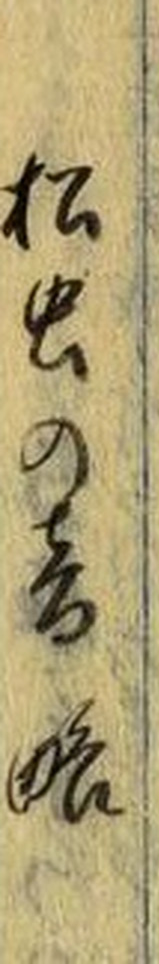松虫の音略
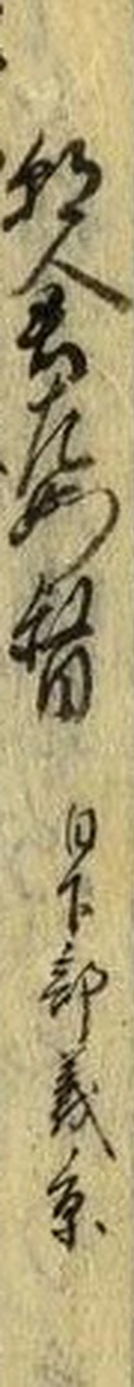朝倉左衛門督日下部義景
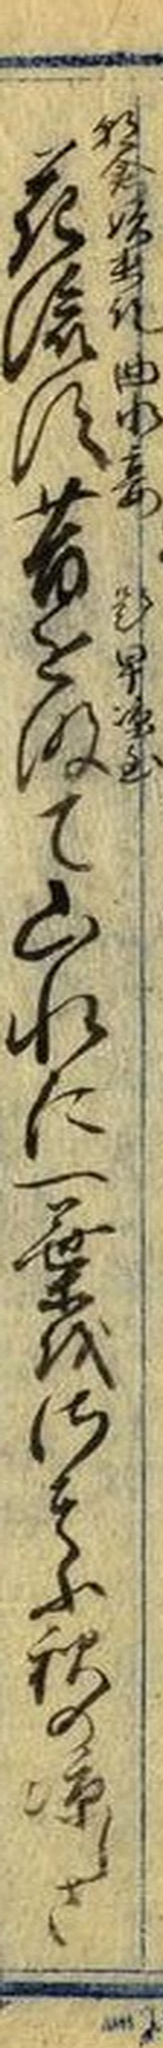花流る昔を汲て山水に一葉をさそふ秋の涼しさ
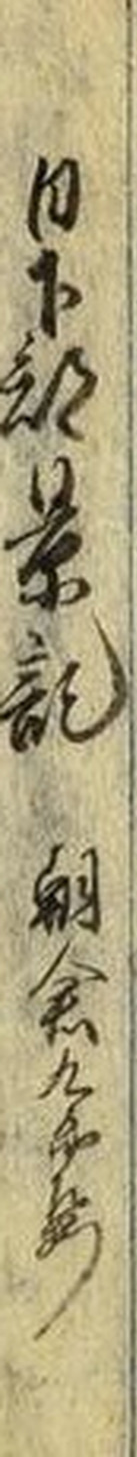日下部景記朝倉九郎左衛門
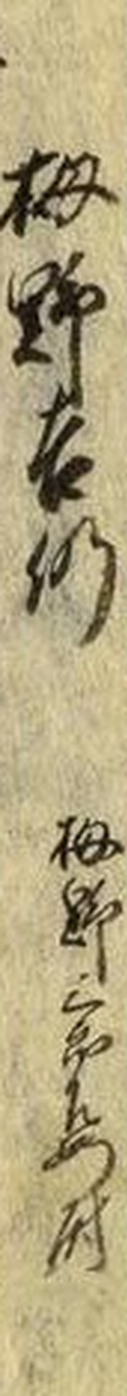栂野吉仍栂野三郎左衛門尉
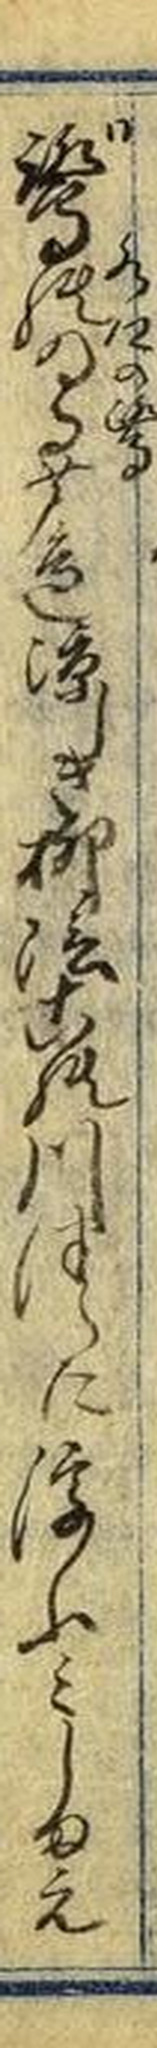鷺のゐる芦邊涼しき柳陰この川つらに停ふみしたえ
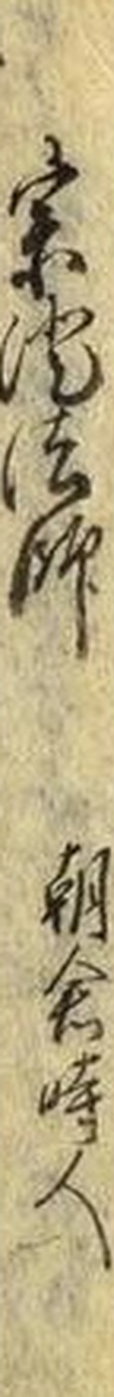宗澄法師朝倉時人
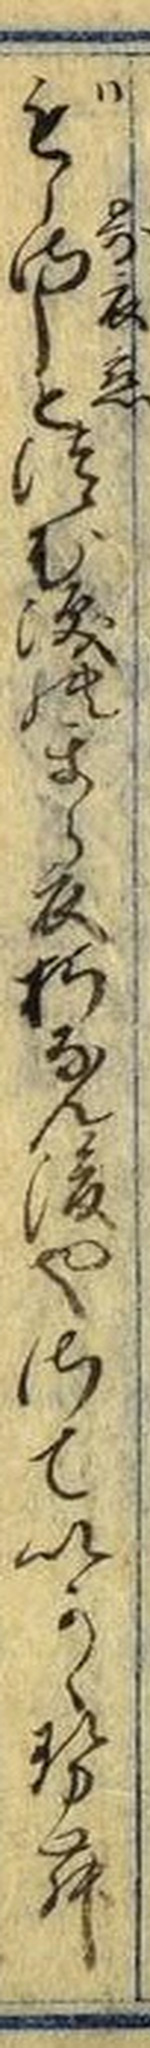もらさしとつゝむ涙のから衣朽なん後やさていかゝせむ

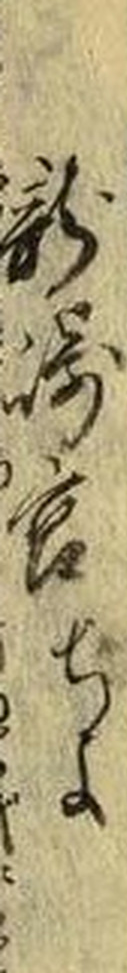龍崎宮ちよ
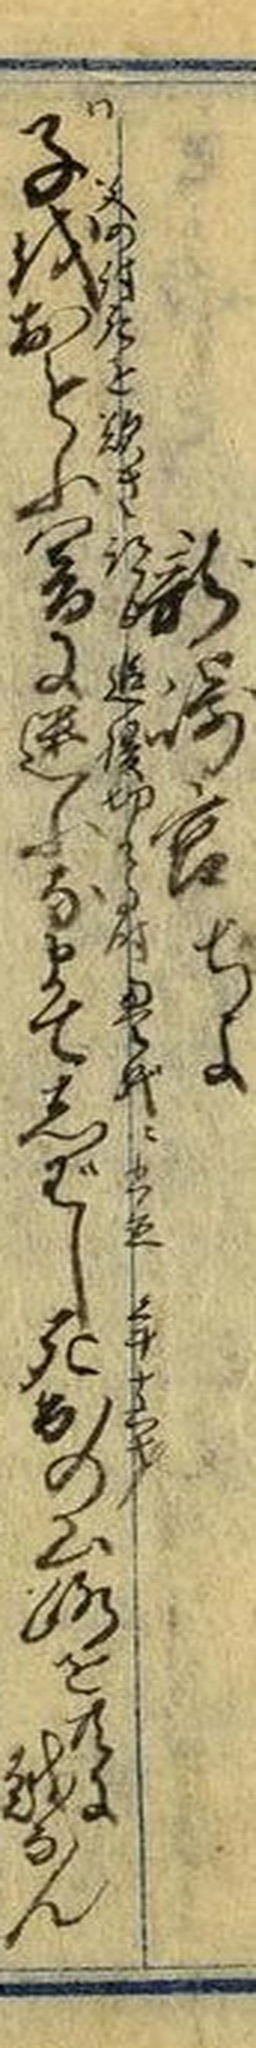子をおもふ闇に迷ふなまてしばし死出の山路を共に越なん
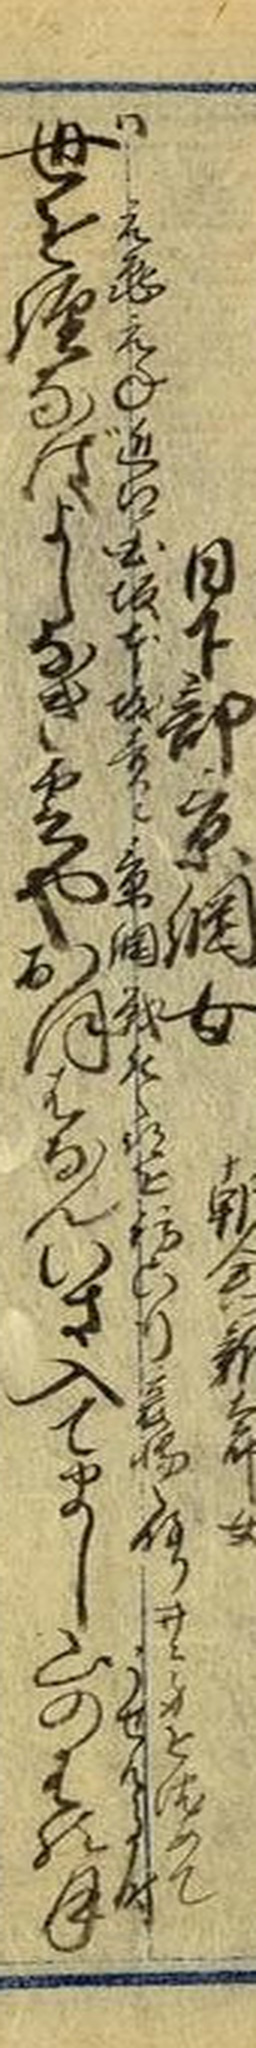世を經なばよしなき雲やおほはなんいさ入てまし山のはの月
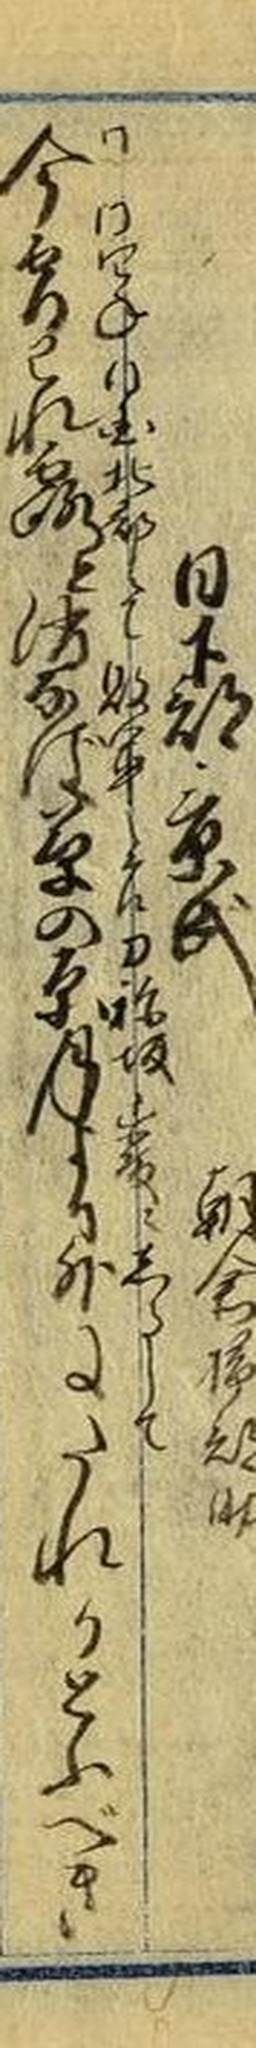今宵われ露と消なば草の原月より外にたれかとふべき
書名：温古集 三巻
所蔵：福井県文書館 Fukui Prefectural Archives
